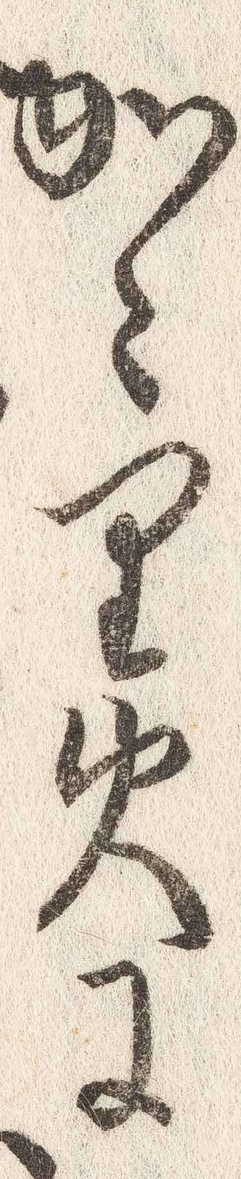かゝり火に
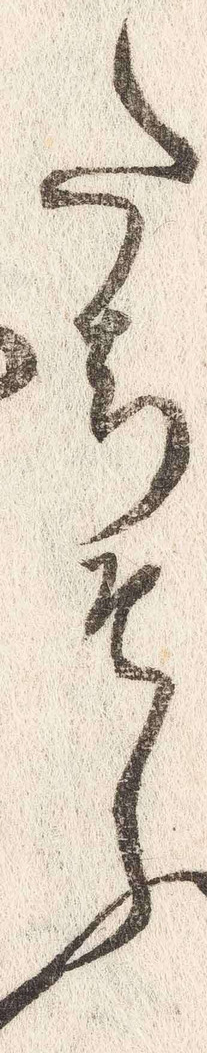たちそふ
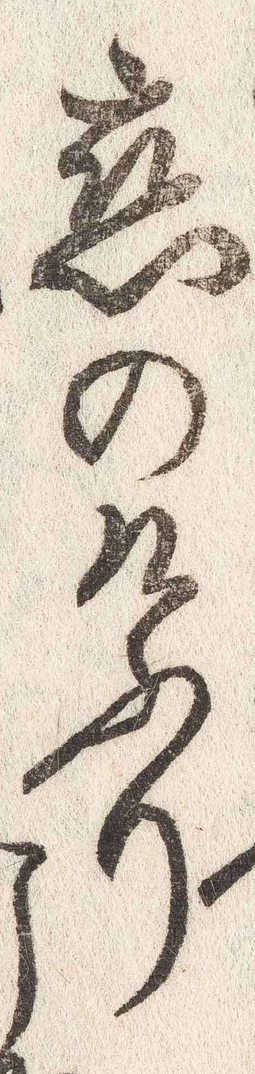恋のけふり
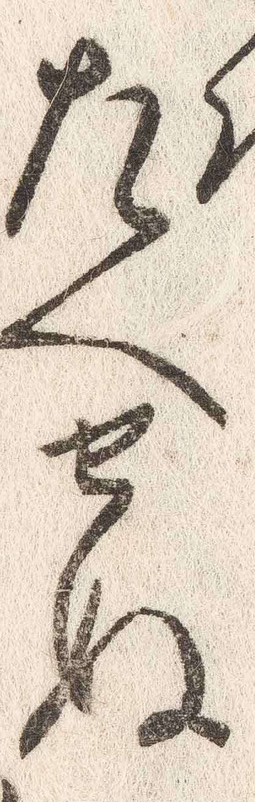たへせぬ
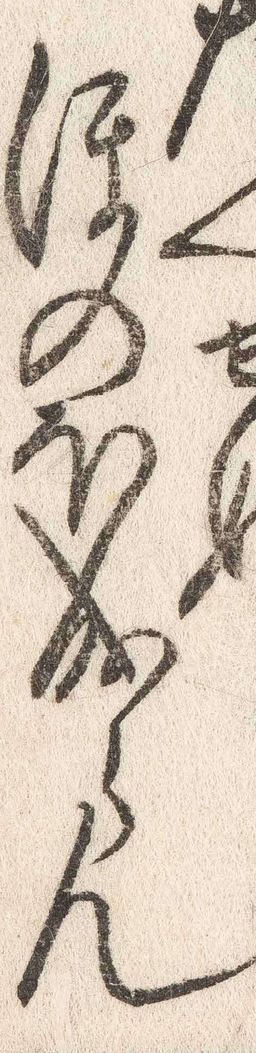ほのほ成らん

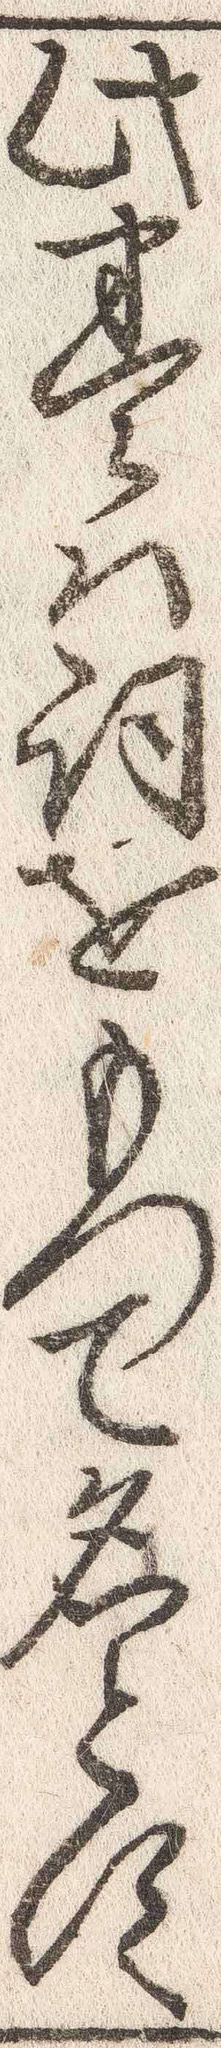此巻は詞をもつて名とす
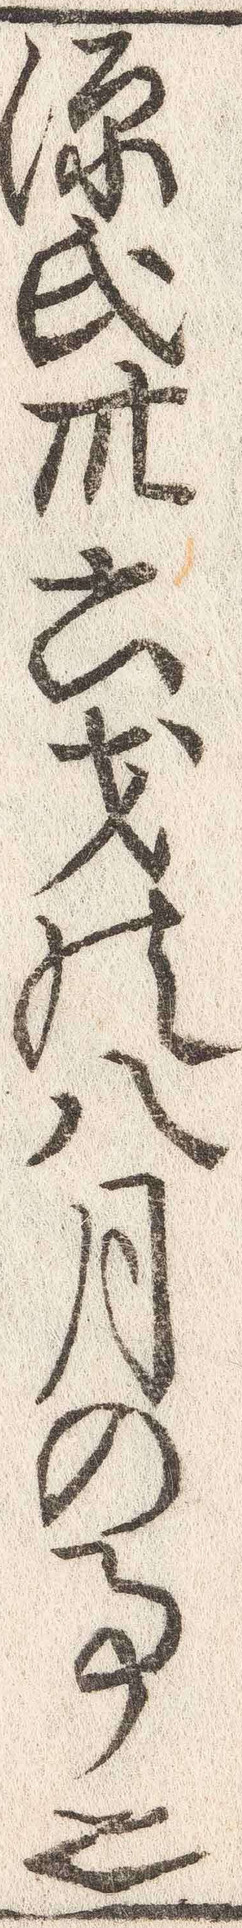源氏卅六才の八月の事也
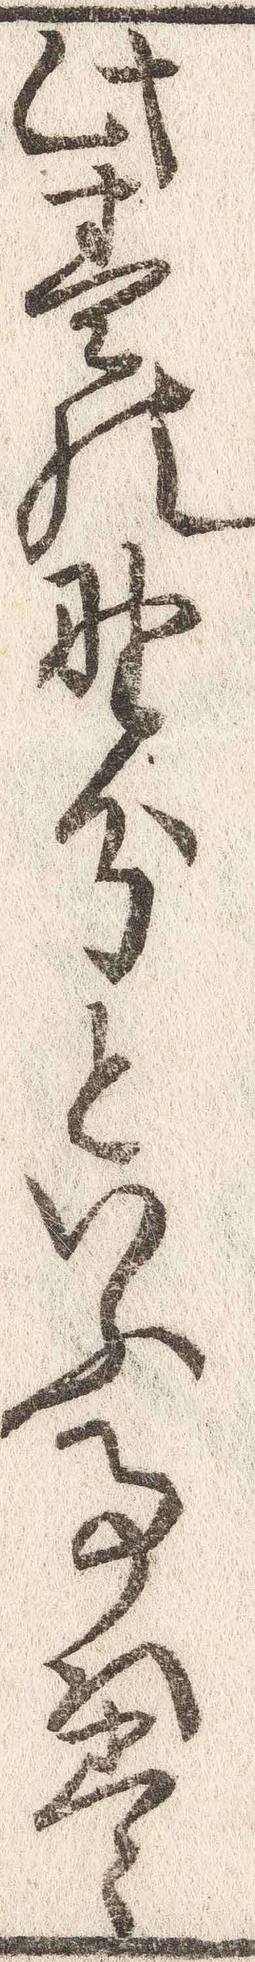此巻の野分といふ事は巻
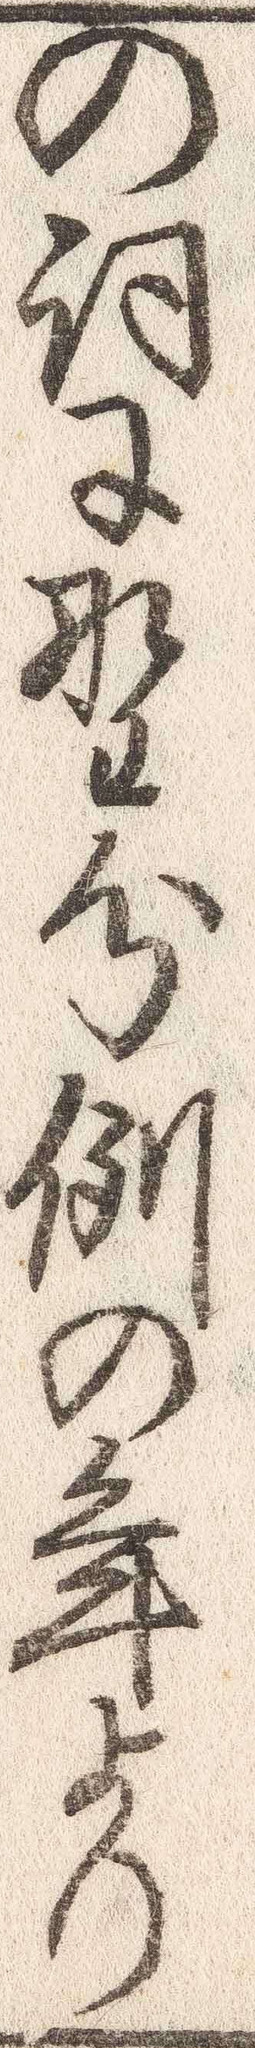の詞に野分例の年より
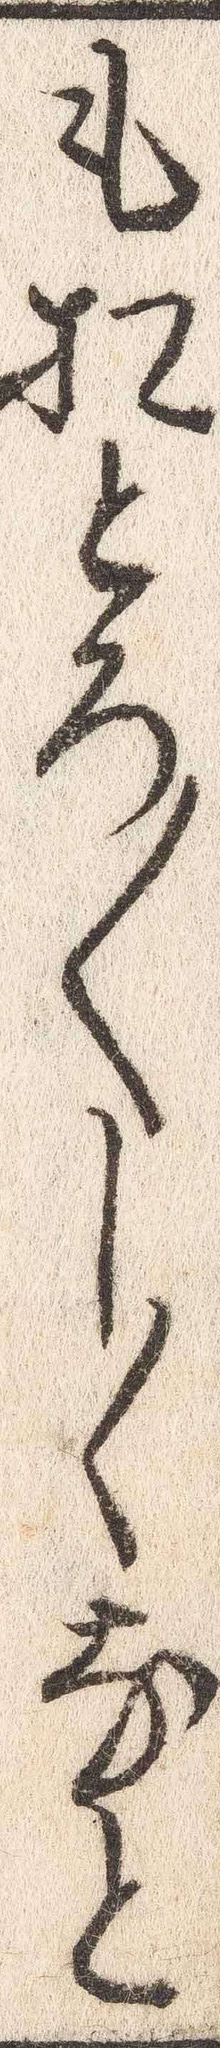もおとろ〳〵しくなと
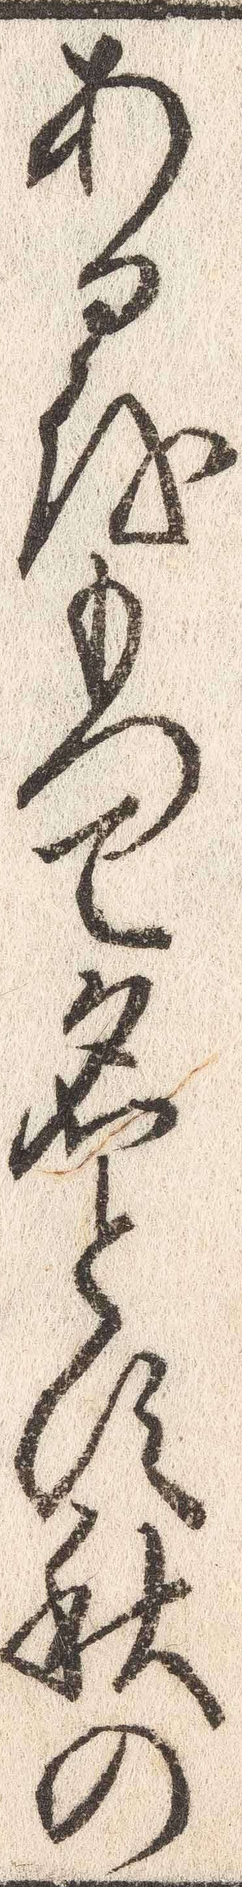あるをもつて名とす秋の
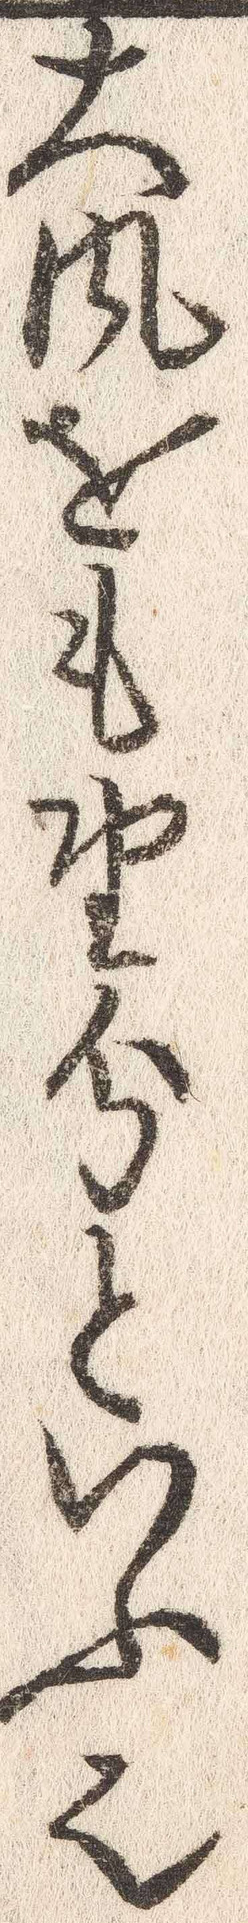大風をも野分といふ也
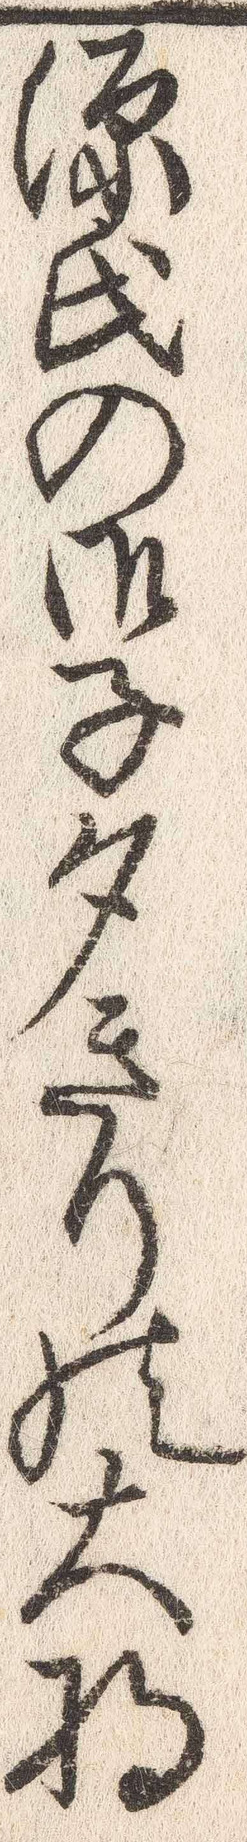源氏の御子夕きりの大将
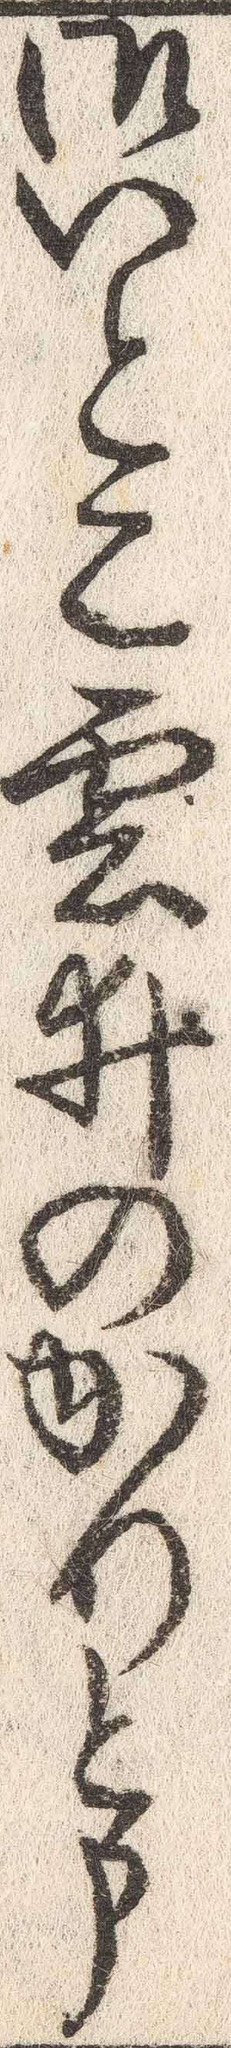御いとこ雲井のかりと申

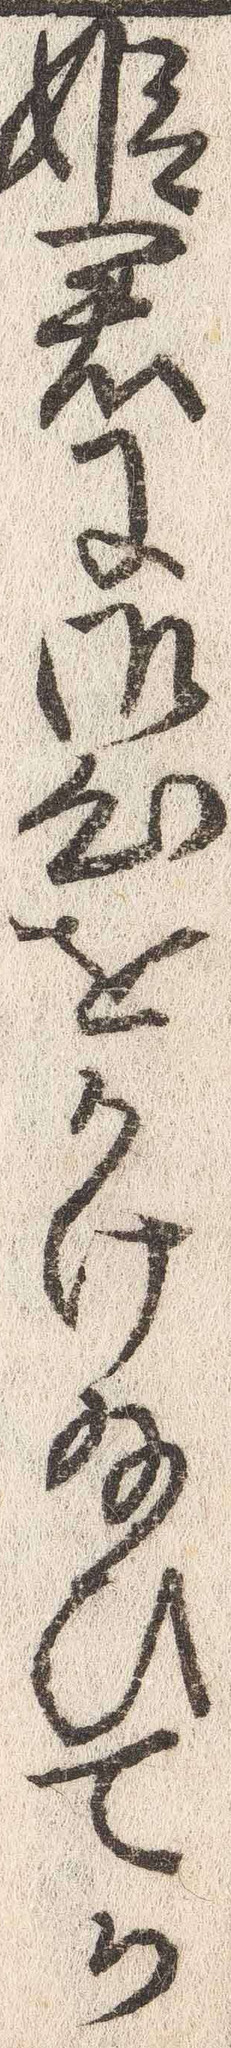姫君に御心をかけ給ひてか
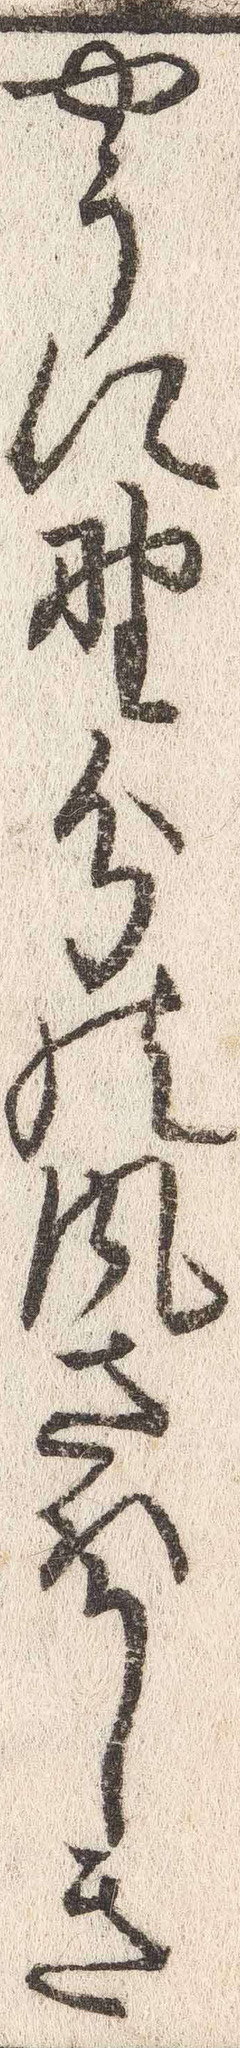やうに野分の風さはかしき
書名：源氏物語
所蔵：東京学芸大学附属図書館 国文学研究資料館
